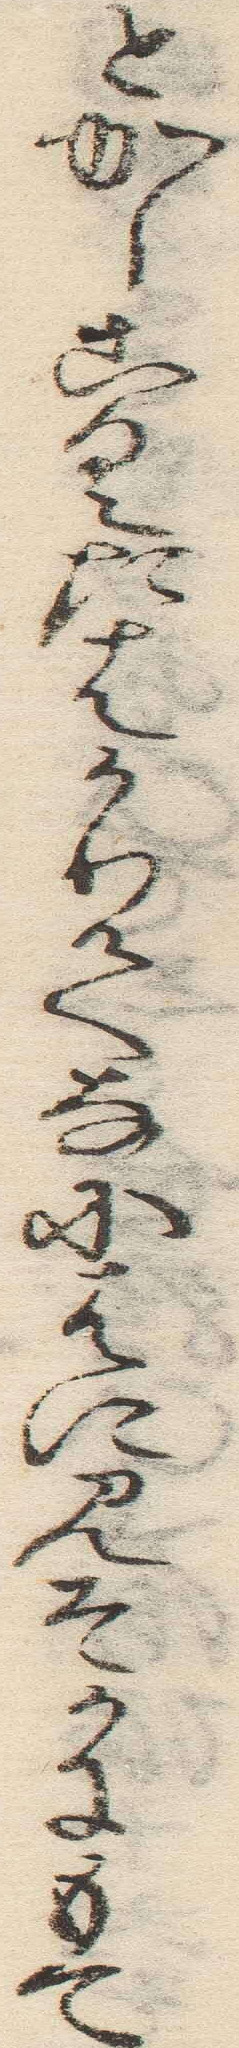とかしこくたはかりてなにはにみそかにもて
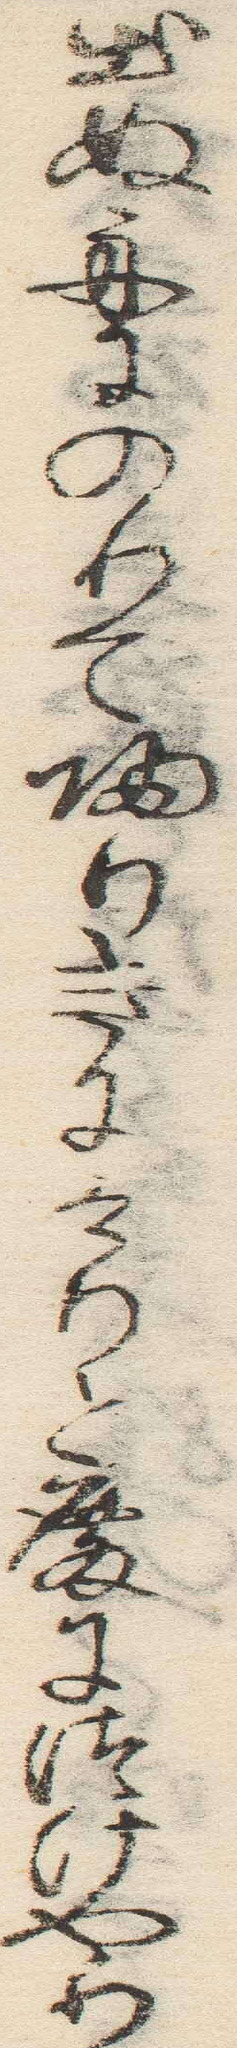出ぬ舟にのりて帰りきにけりと殿につけやり
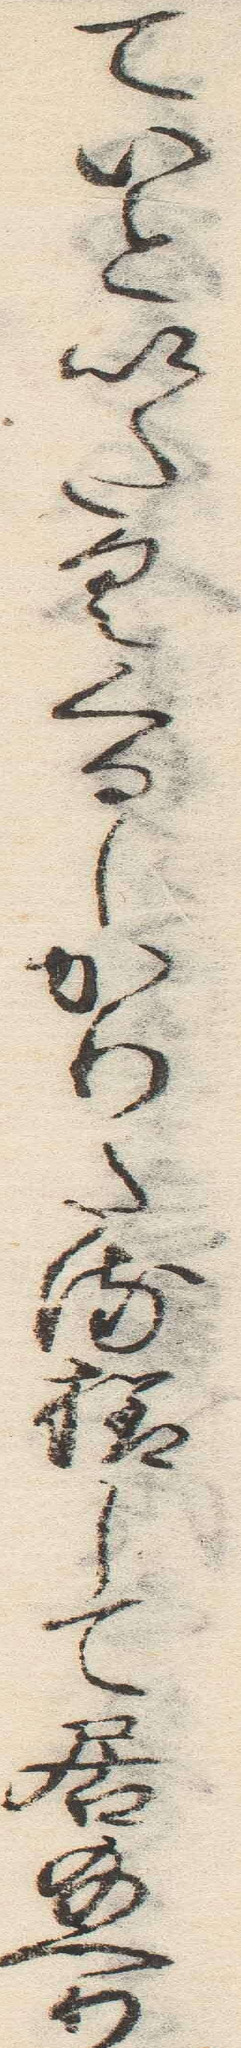ていといたくくるしかりたる様して居給へり
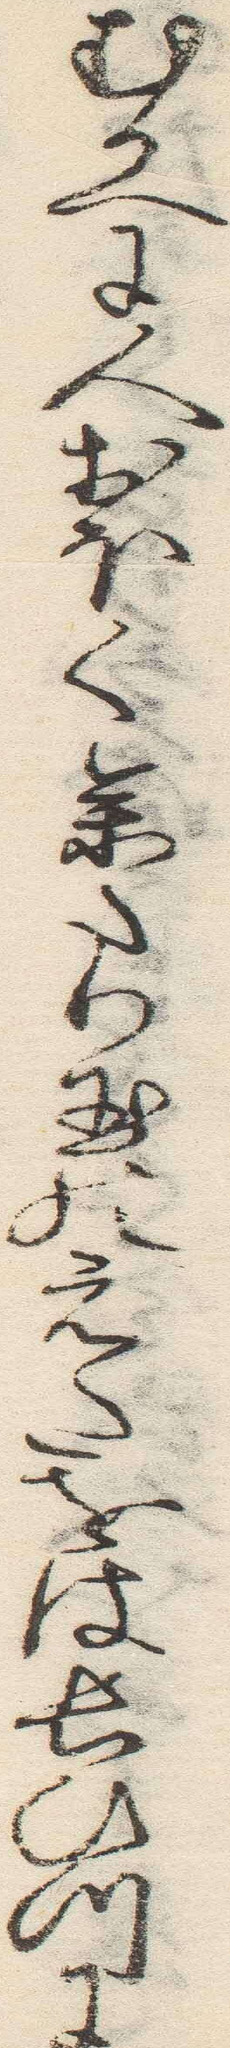むかへに人おほく参たり玉のえたをは長ひつに
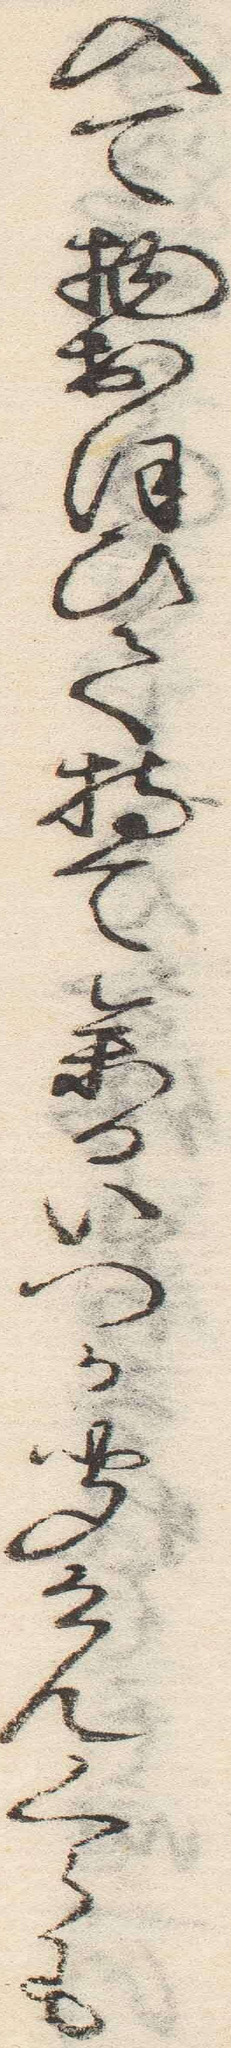入て物おほひて持て参るいつか聞けんくらも
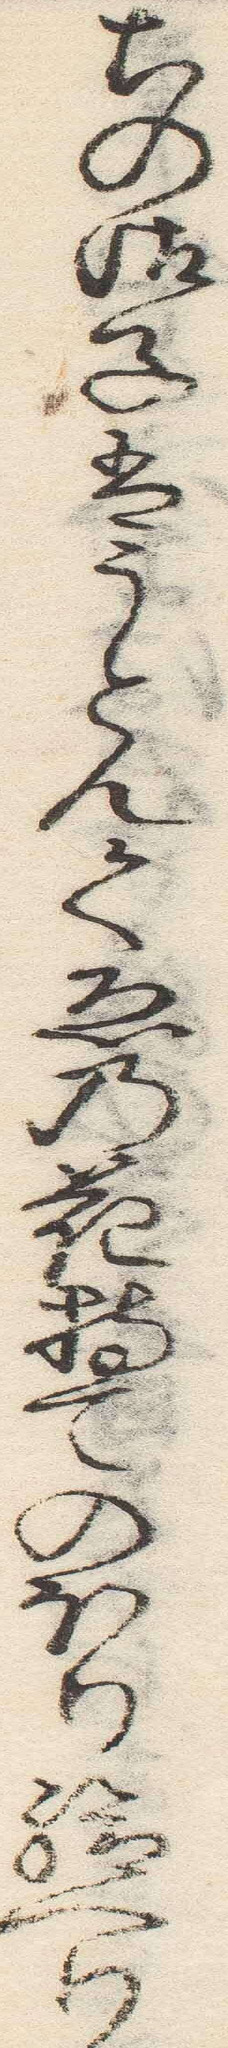ちの御子はうとんてゑの花持てのほり給へり
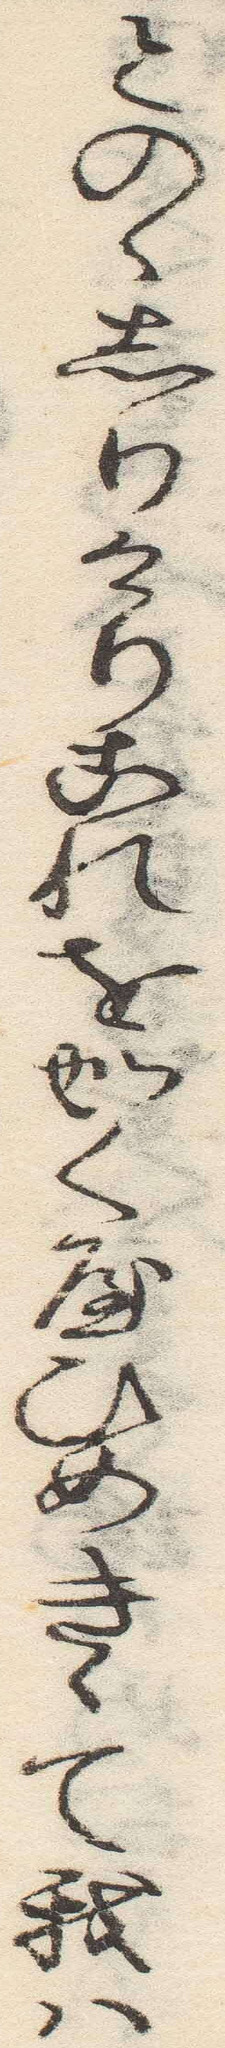とのゝしりけりこれをかくやひめきゝて我は
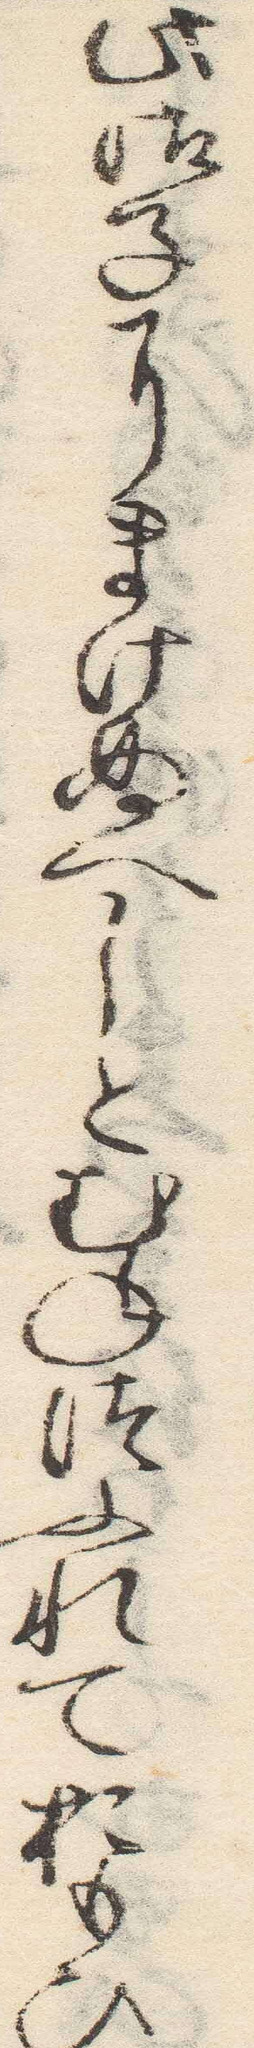此御子にまけぬへしとむねつふれておもひ
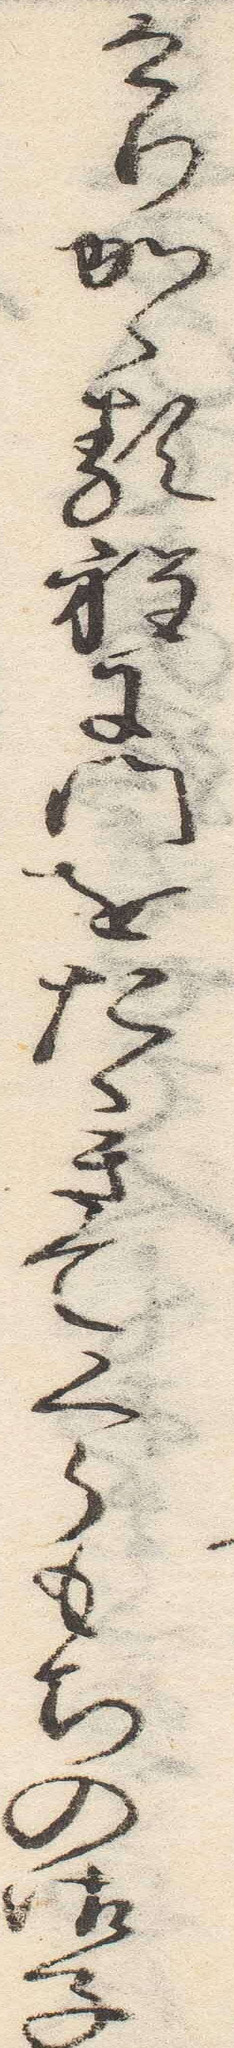けりかゝる程に門をたゝきてくらもちの御子
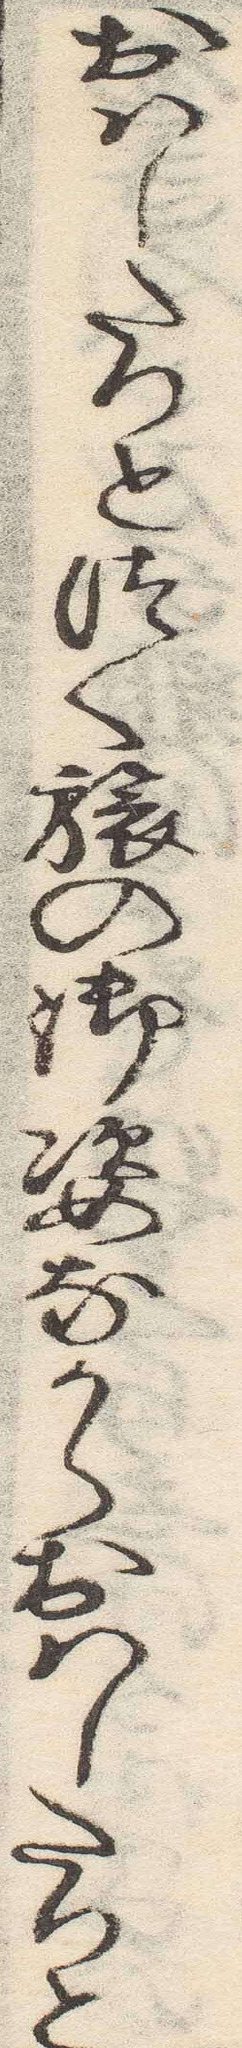おはしたりとつく旅の御姿なからおはしたりと

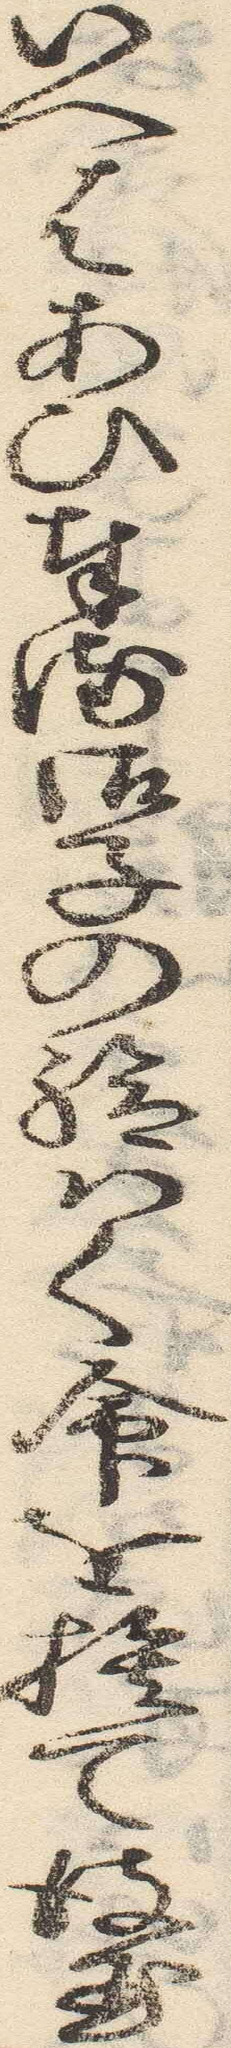いへはあひ奉る御子の給はく命を捨て彼玉
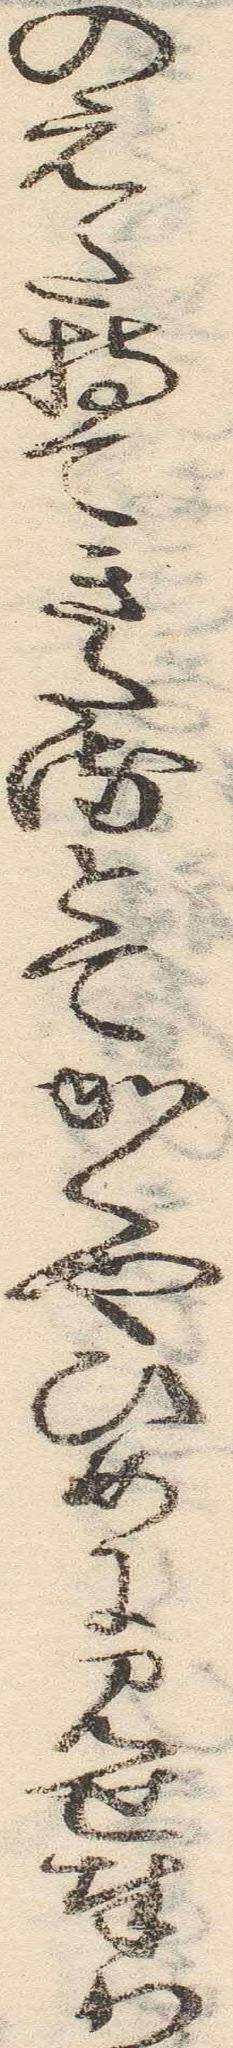のえき持てきたるとてかくひめに見せ奉り
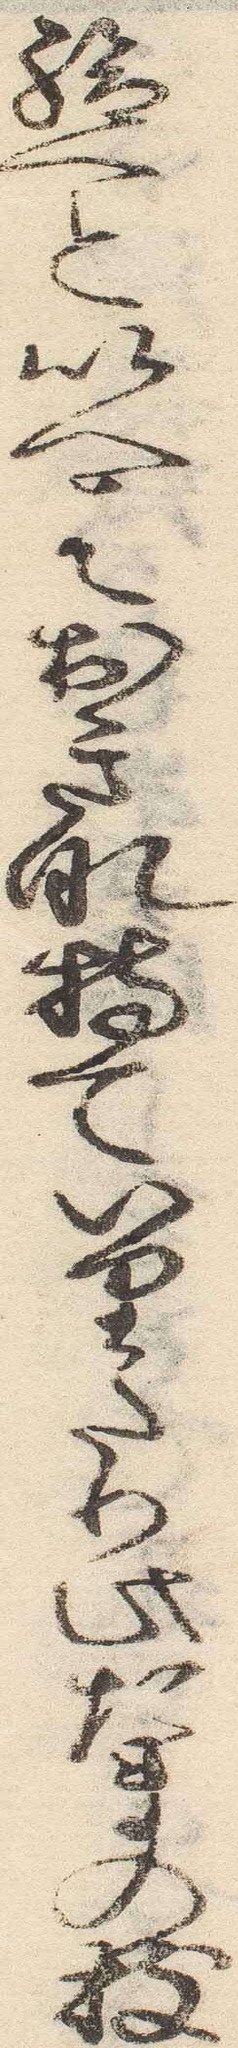給へといへはおきな持ていりたり此たまの枝
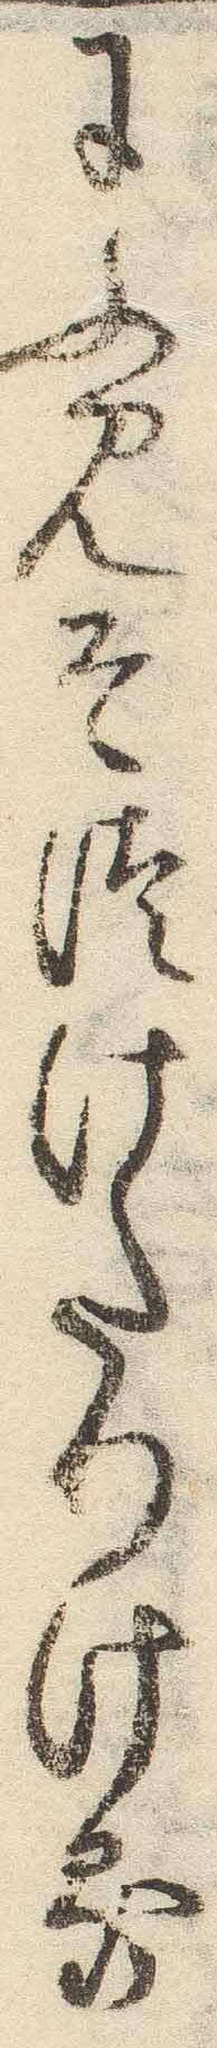にふみそつけたりける
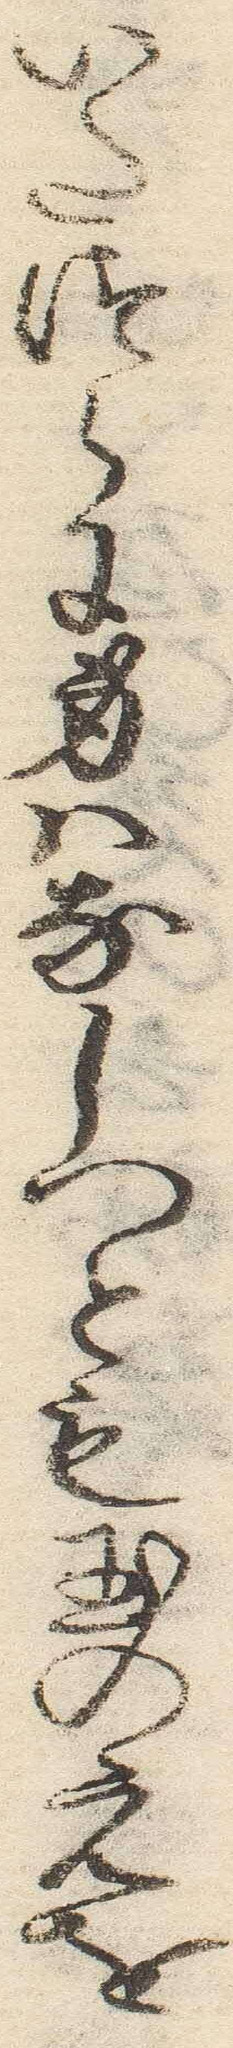いたつらに身はなしつとも玉のえを
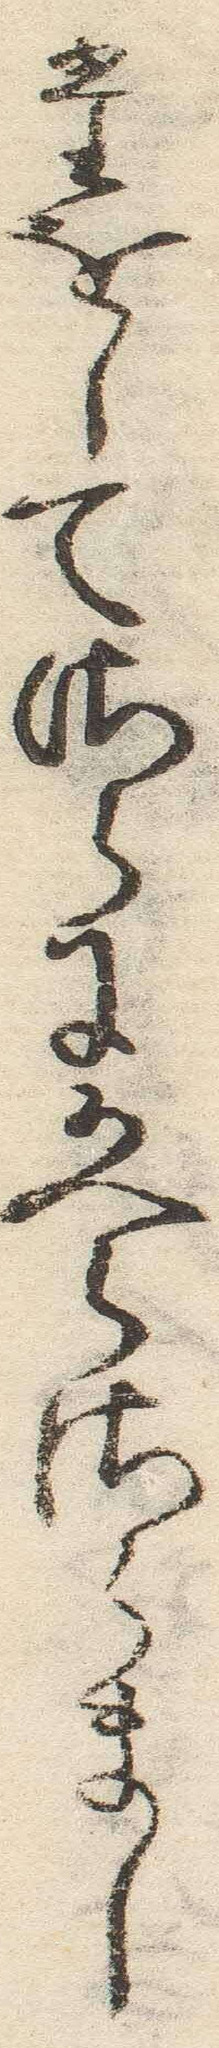たをしてさらにかへらさらまし
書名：竹取物語
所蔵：東京学芸大学附属図書館 国文学研究資料館
